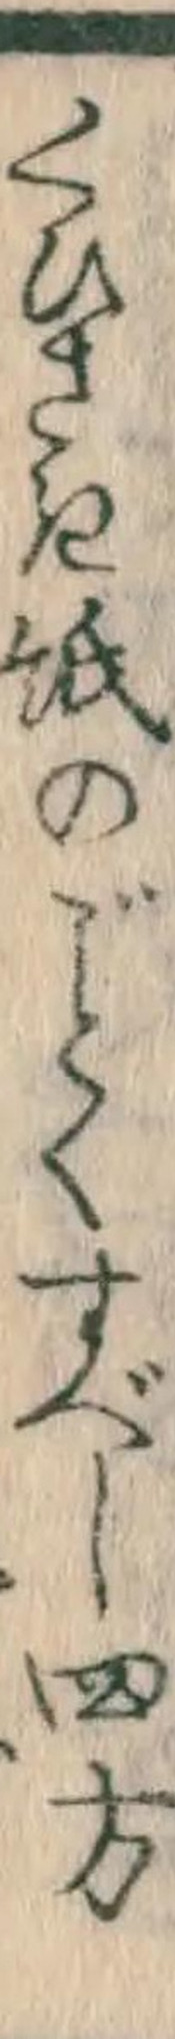くひさき紙のごとくすべし四方
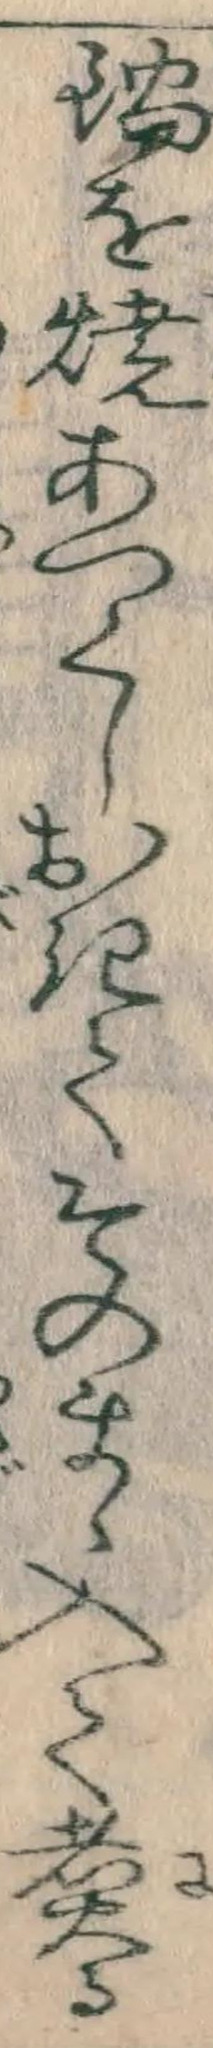鍋を焼あつくしおきてそのまゝ入て煮る
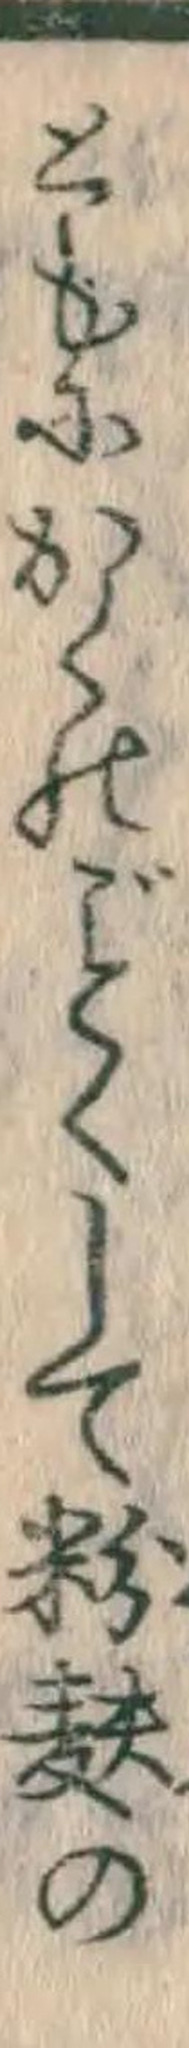ともにかくのごとくして粉麩の
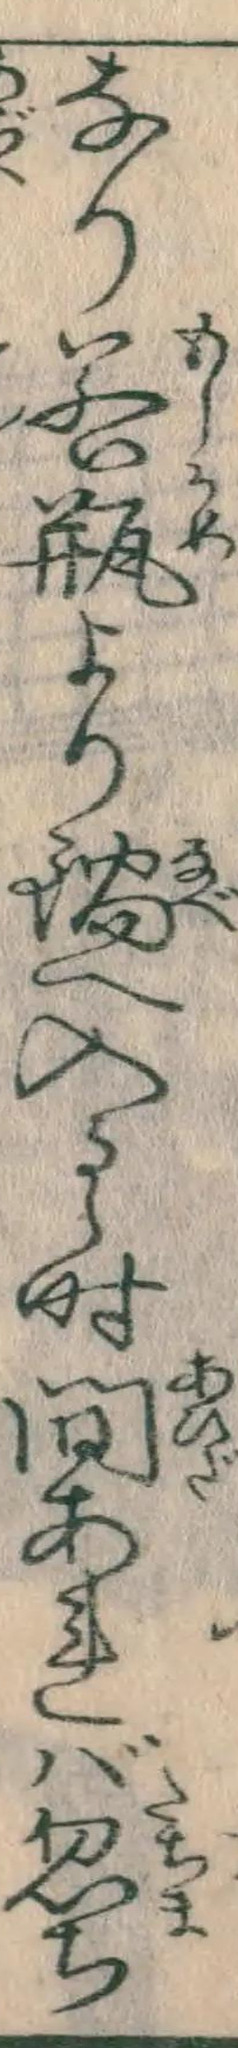なり若瓶より鍋へ入るゝ時間あれば忽ち
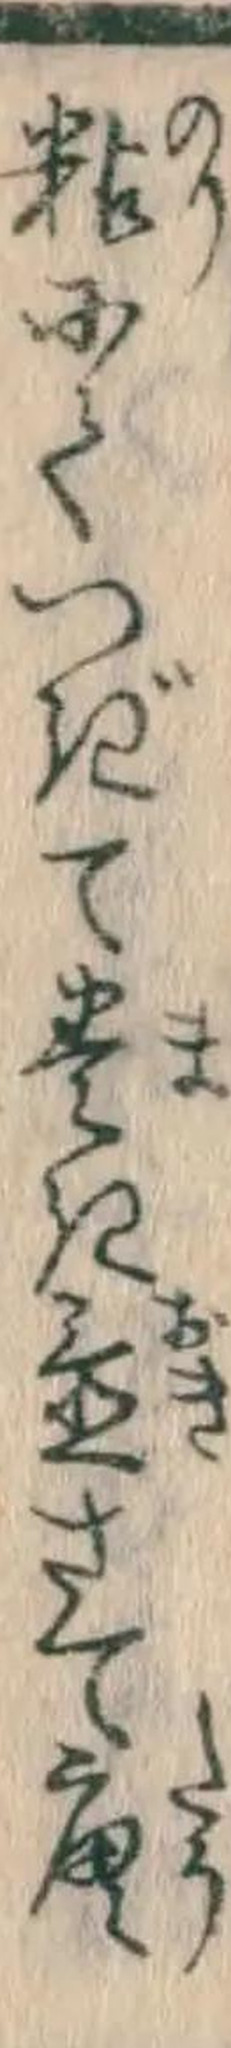粘にてつぎて巻き置さて唐
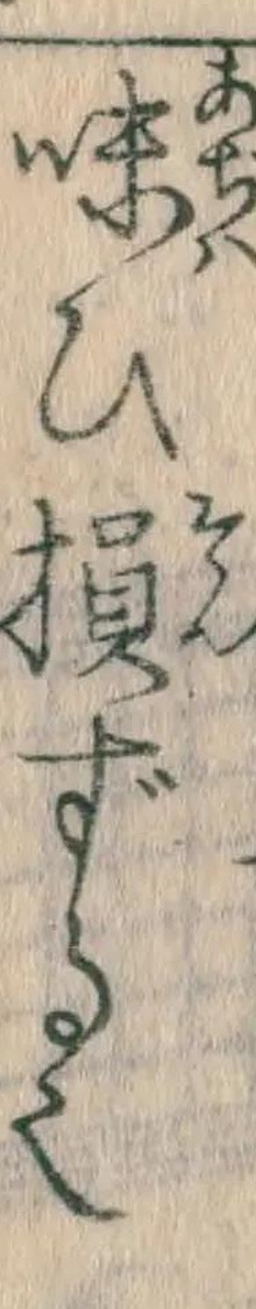味ひ損ずる也
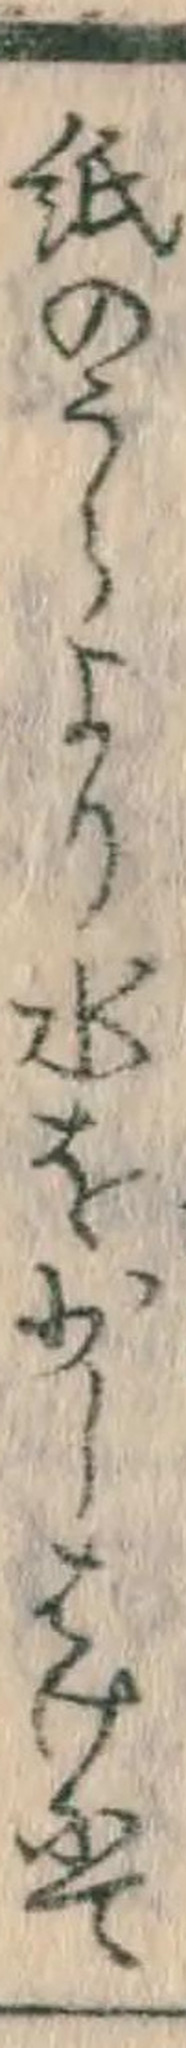紙うらより水を少しはけにて
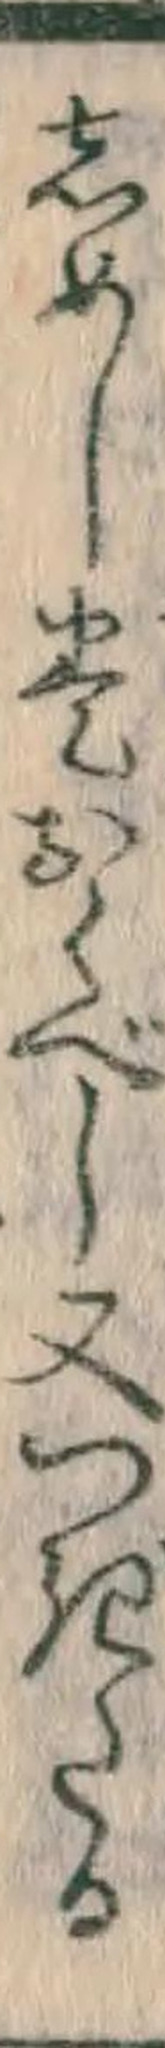しめし巻おくべし又つぎたる
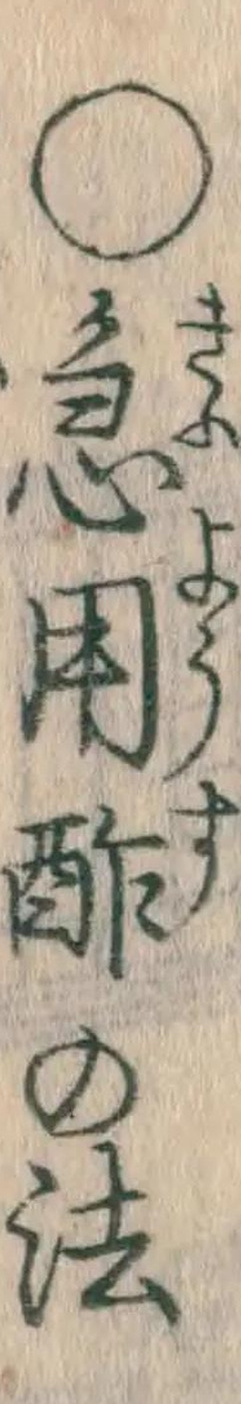○急用酢の法
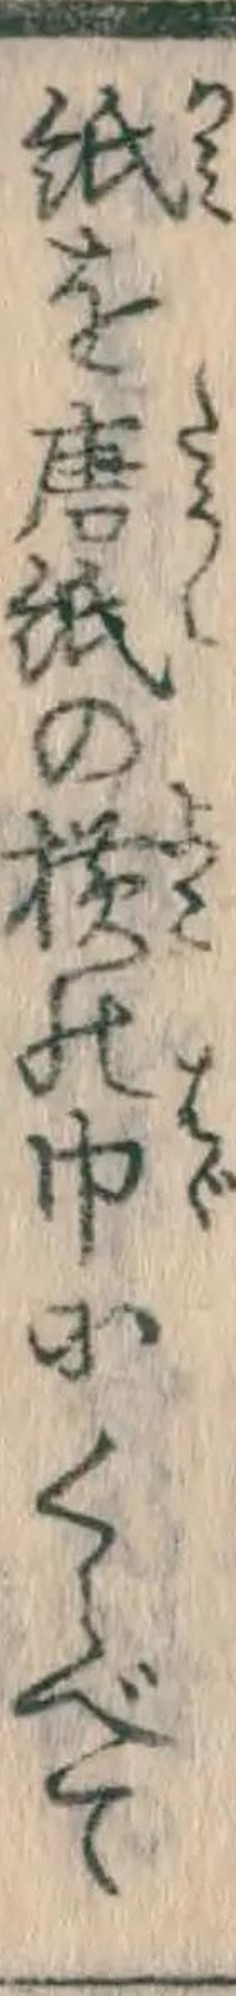紙を唐紙の横の巾にくらべて
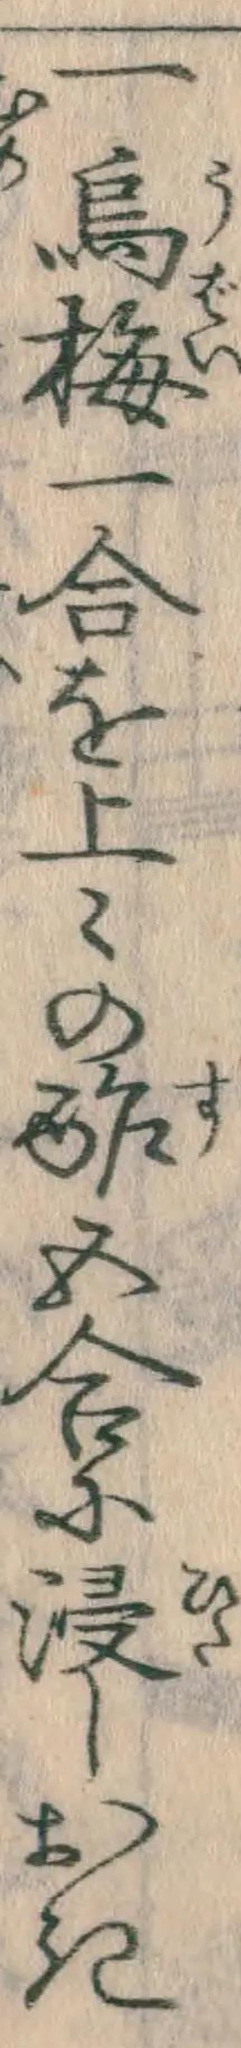一烏梅一合を上々の酢五合に浸しおき
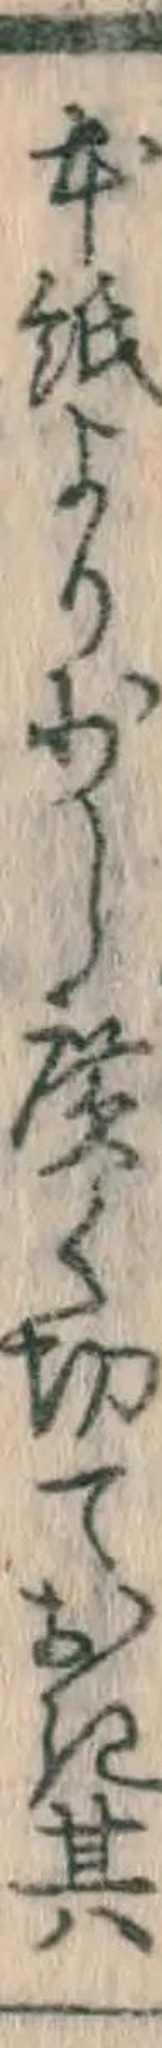本紙より少し広く切ておき其
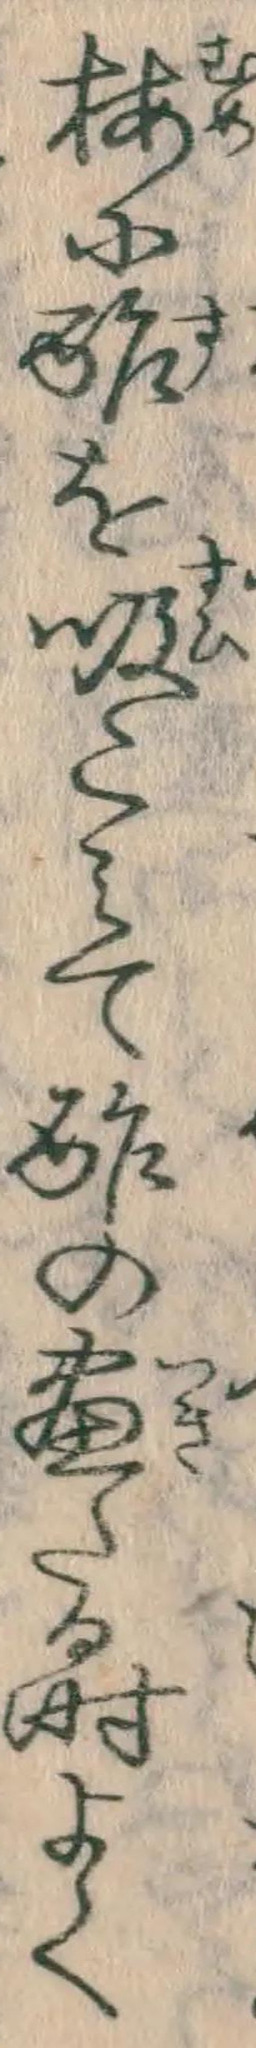梅に酢を吸こみて酢の尽たる時よく
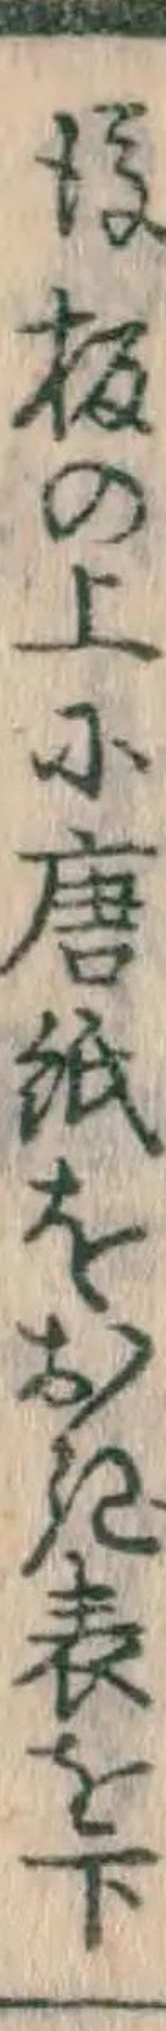後板の上に唐紙をおき表を下
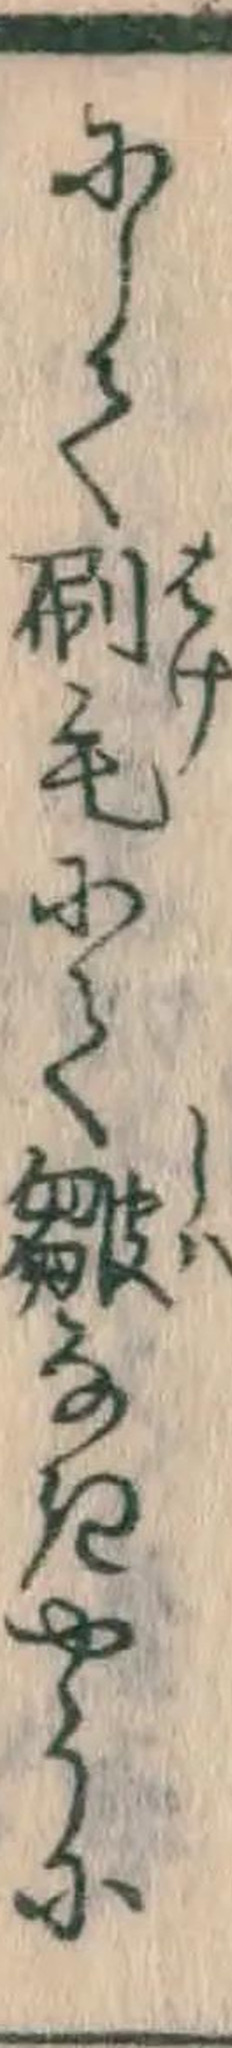にして刷毛にて皺なきやうに
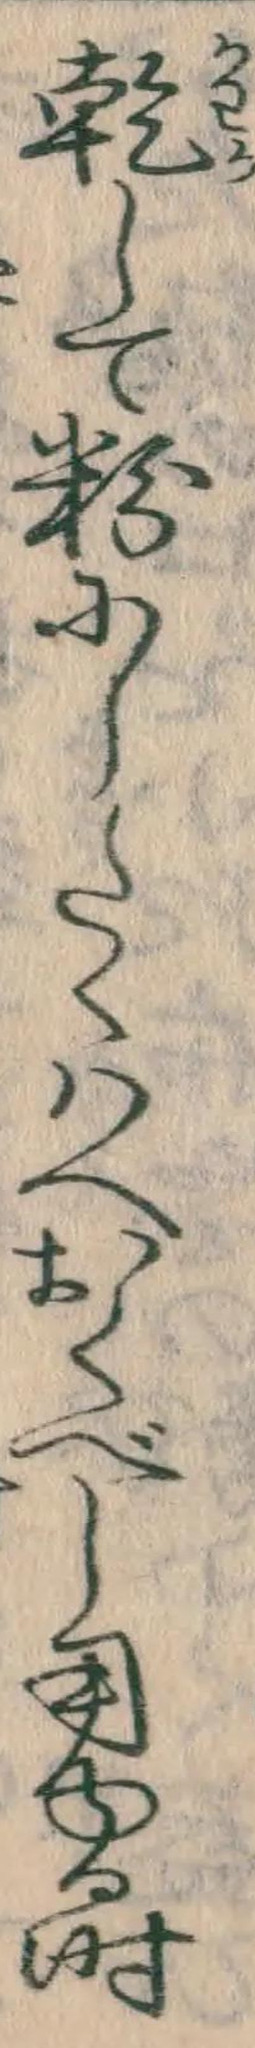乾して粉にしたくはへおくべし用ゆる時
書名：広益秘事大全 3巻. [2]
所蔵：国立国会図書館 National Diet Library, JAPAN
